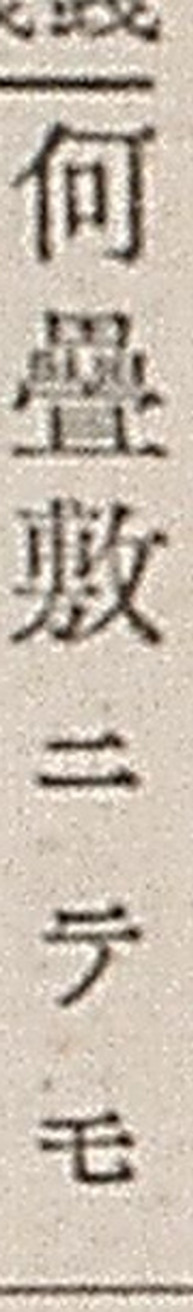何畳敷二テモ
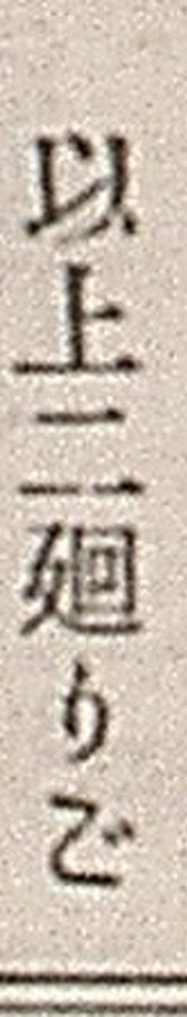以上二廻りご
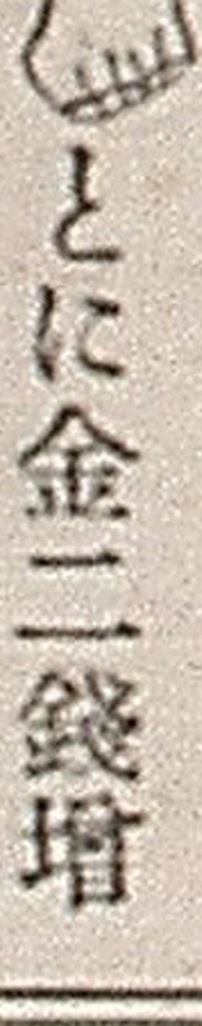とに近二銭増
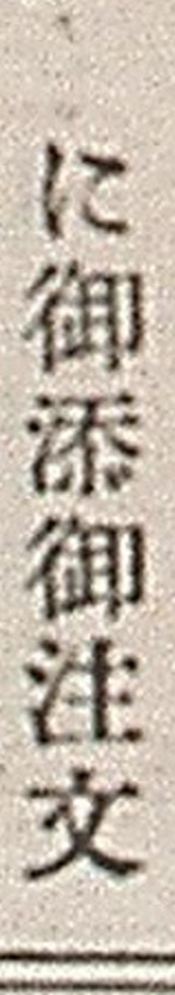に御添御注文
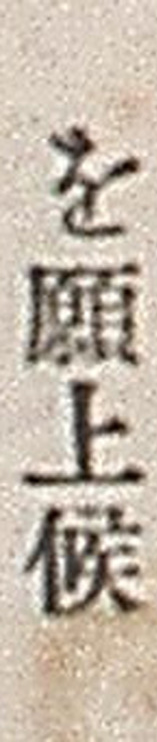を願上候
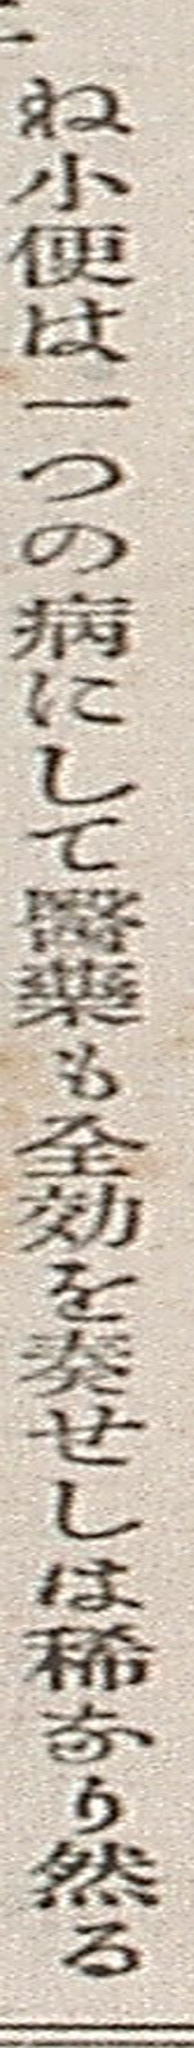主ね小便は一つの病にして医薬も全効を奏せしは稀なり然る
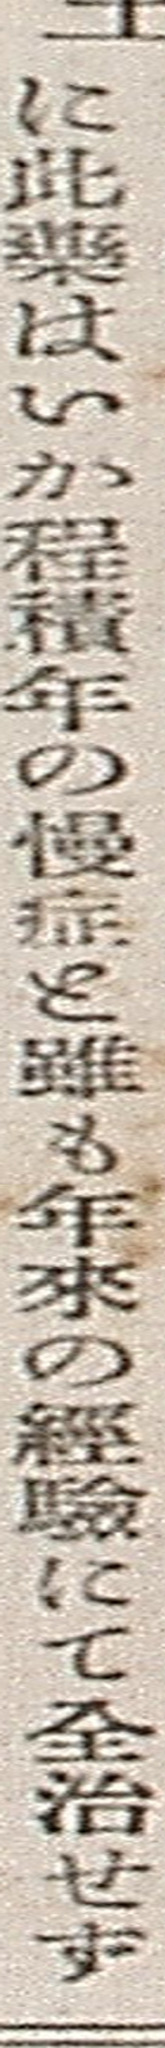に此薬はいか程積年の慢性と雖も年来の経験にて完治せず
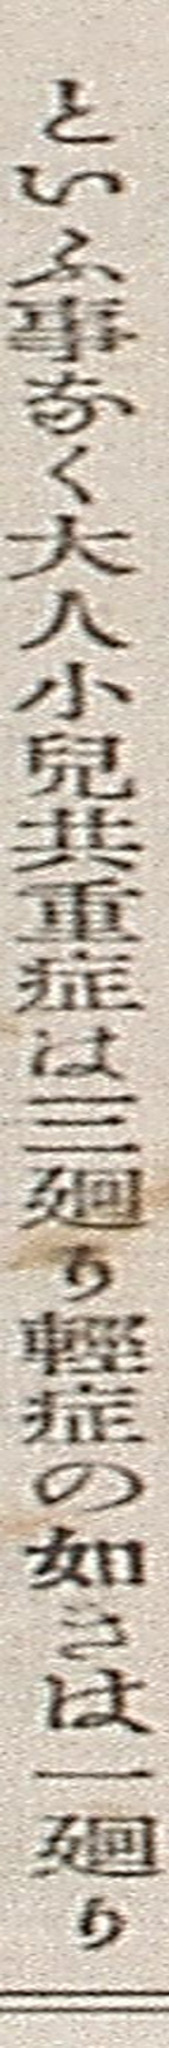といふ事なく大人小兒共重症は三廻り軽症の如きは一廻り
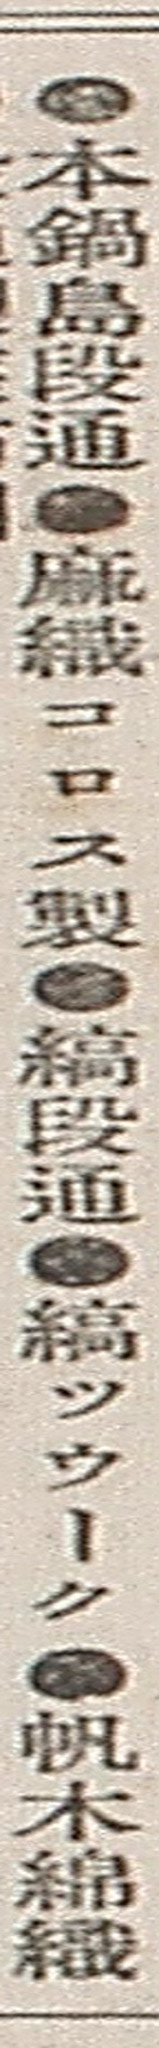●本鍋島段通●麻織コロス製●縞段通●縞ツーク●帆木綿織
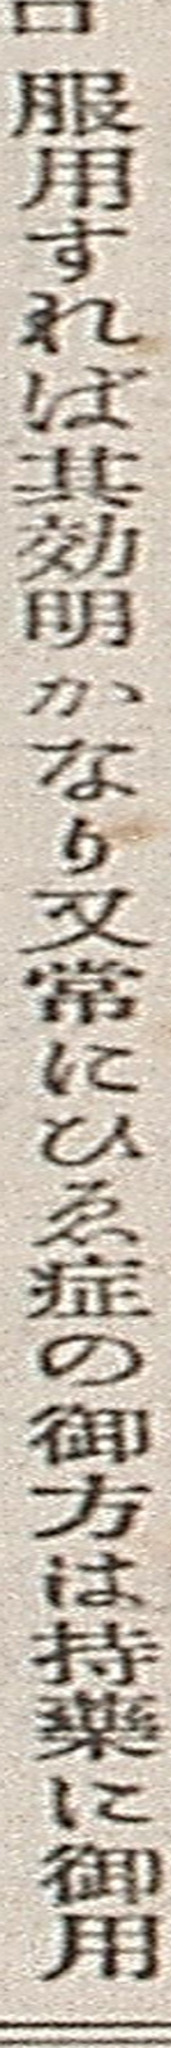治服用すれば其効用かなり又常にひゑ症の御方は特薬に御用
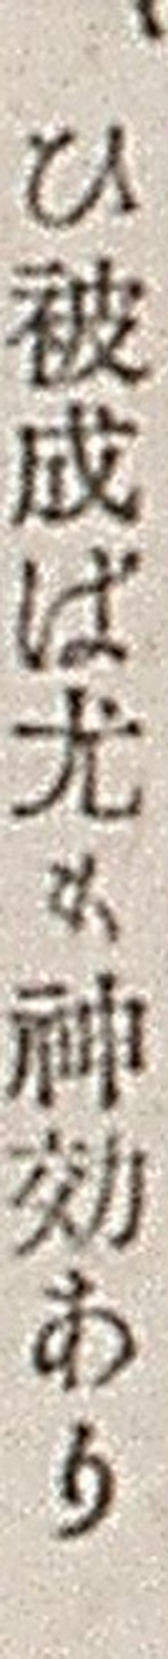ひ被成ば尤も神効あり
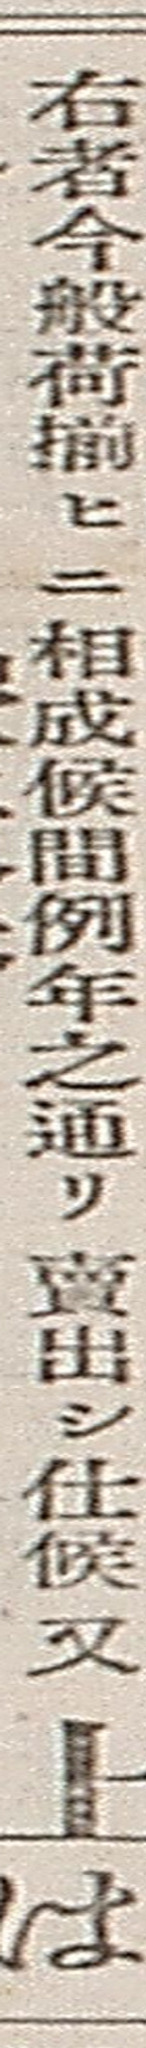右者今般荷揃ヒ二相成候間例年之通リ売出シ仕候又上は
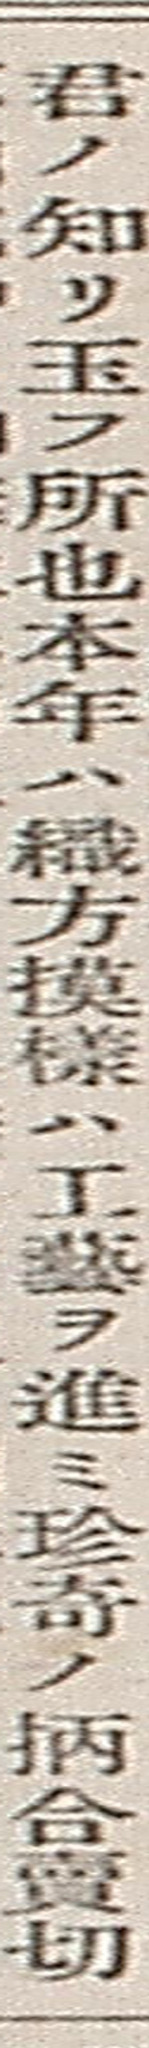君ノ知リ玉フ所也本年ハ織方模様ハ工芸ヲ進ミ珍奇ノ柄合売切
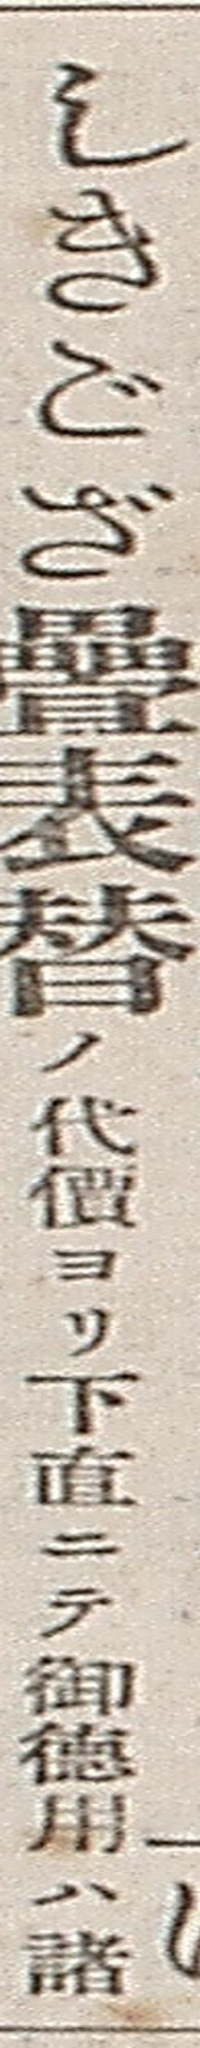しきござ畳表替ノ代価ヨリ下値ニテ御徳用ハ諸
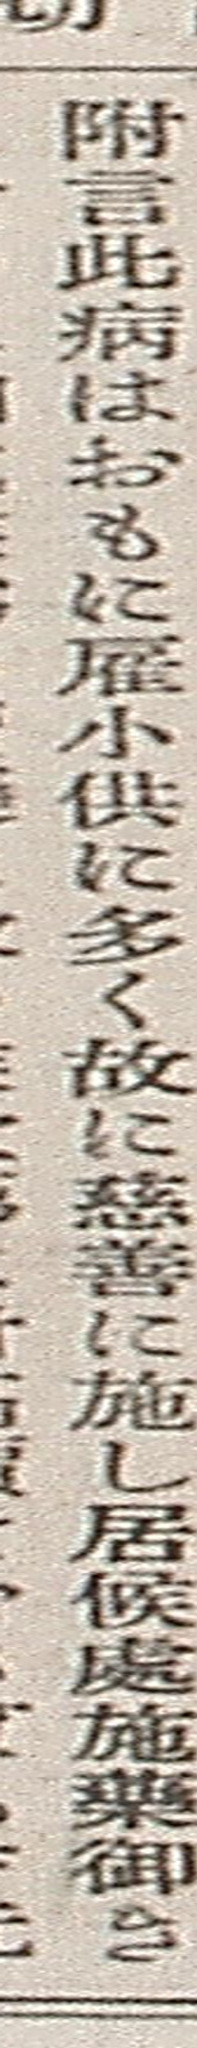附言此病はおもに雇子供に多く故に慈善に施し居候処施薬御き
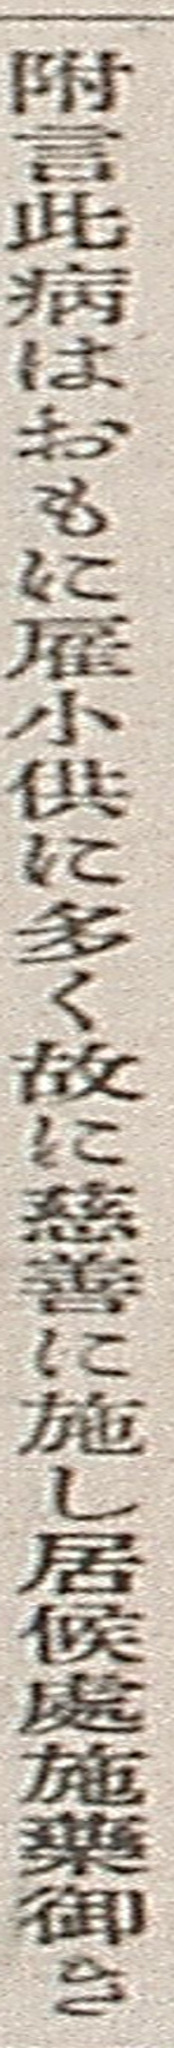附言此病はおもに雇子供に多く故に慈善に施し居候処施薬御き
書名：風俗畫報臨時増刊第百二十八號　洪水被害録（下）
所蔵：東京大学地震研究所図書室 Earthquake Research Institute Library, The University of Tokyo, JAPAN
